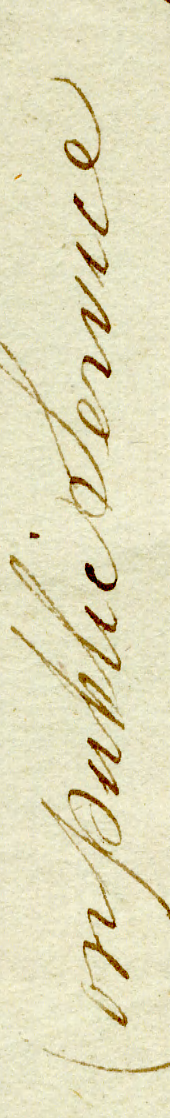on public Service
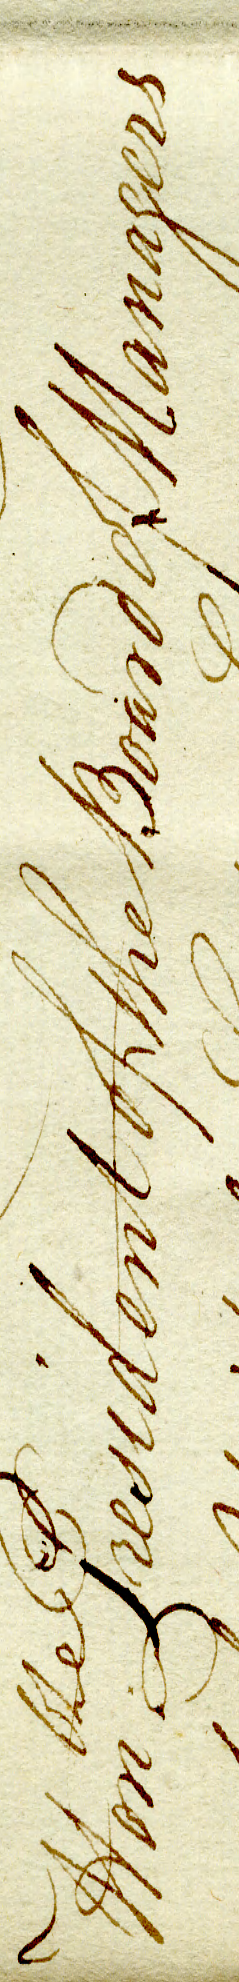Hon^ble. President of the Board of Managers
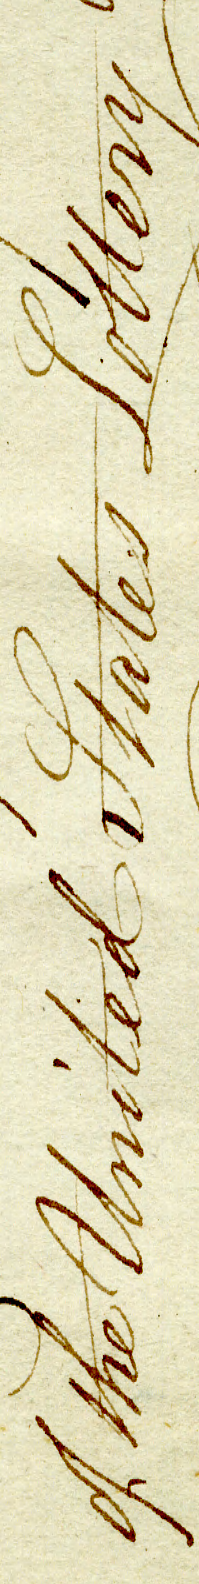of the United States Lottery
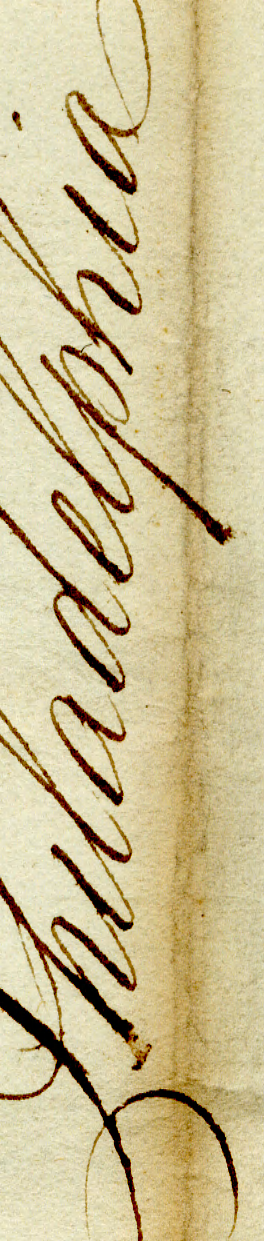Philadelphia
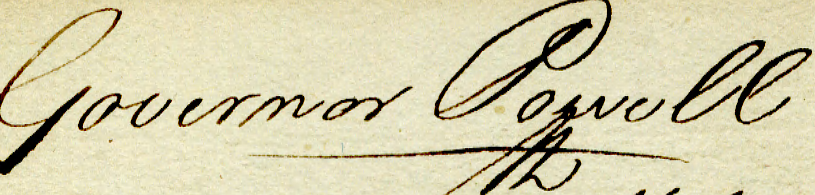Governor Powell
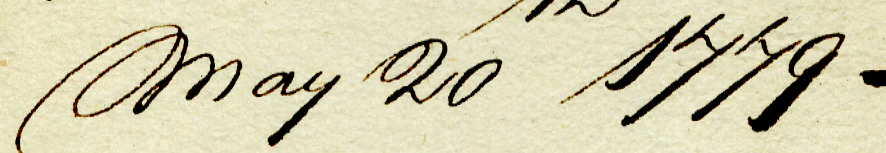May 20^th 1779
